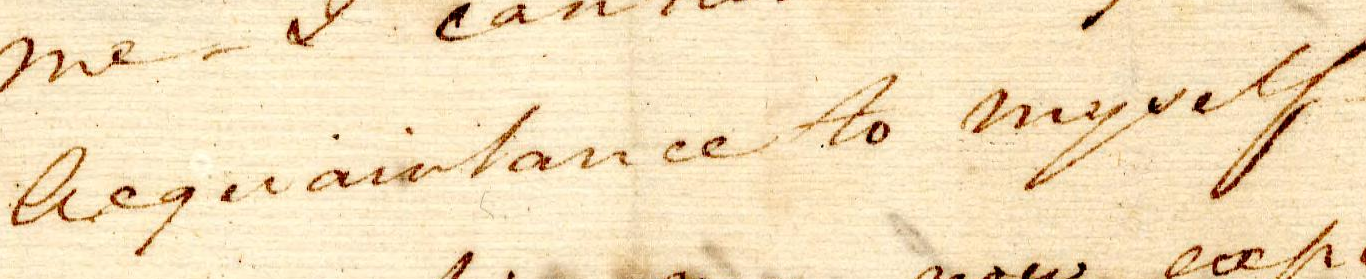Acquaintance to myself-
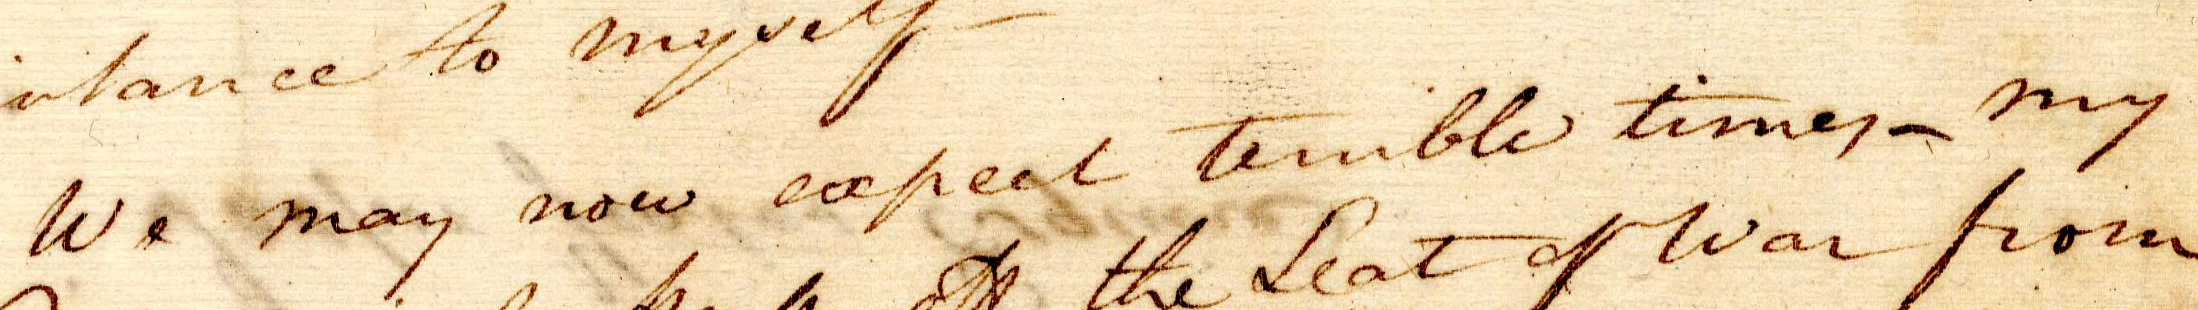We may now expect terrible times- my
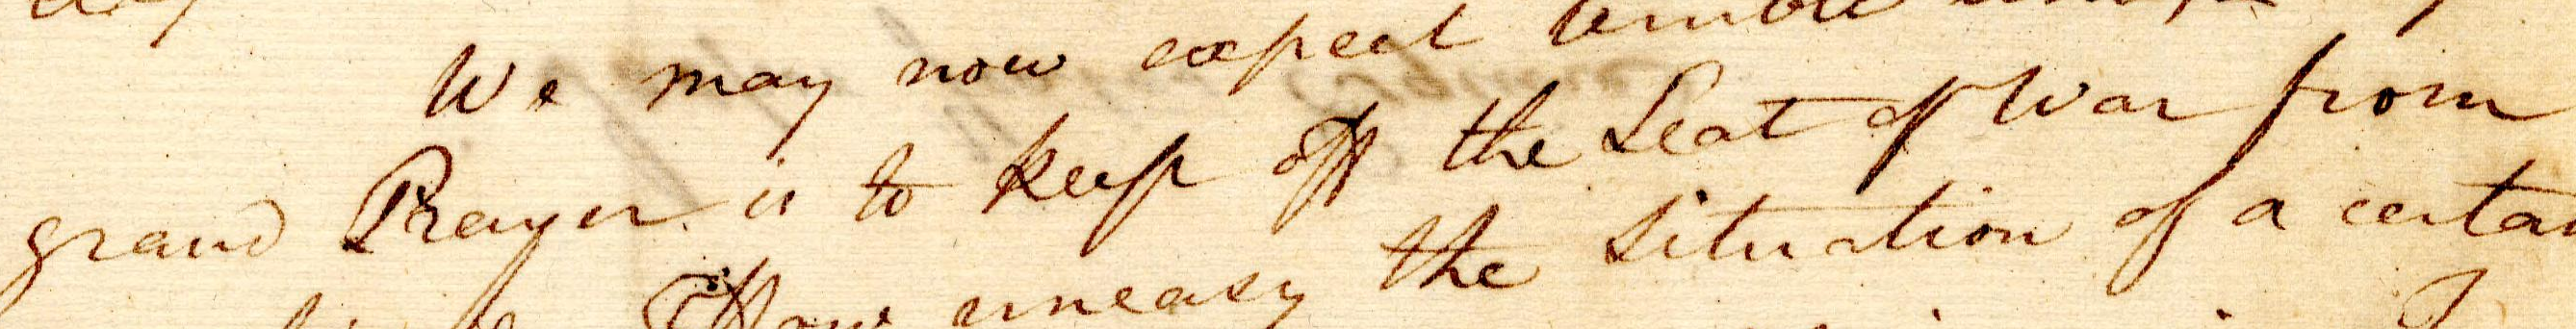grand Prayer is to keep off the Seat of war from
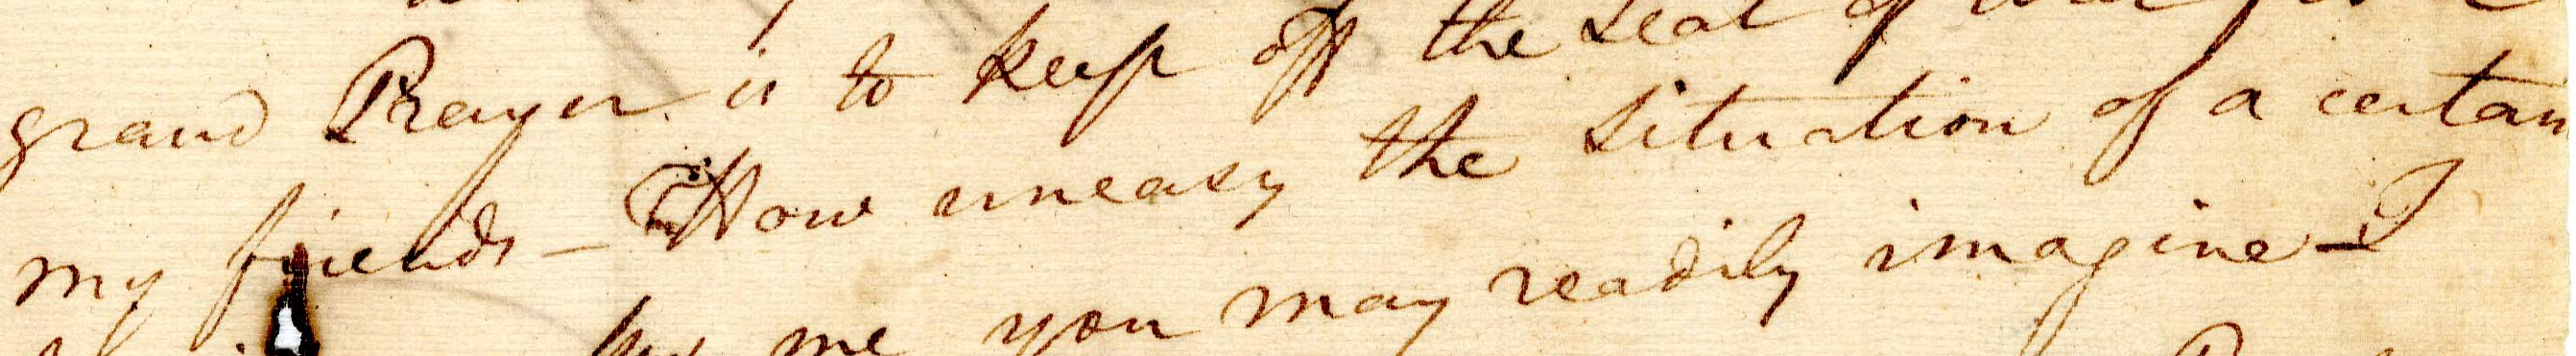my friends- How uneasy the Situation of a certain
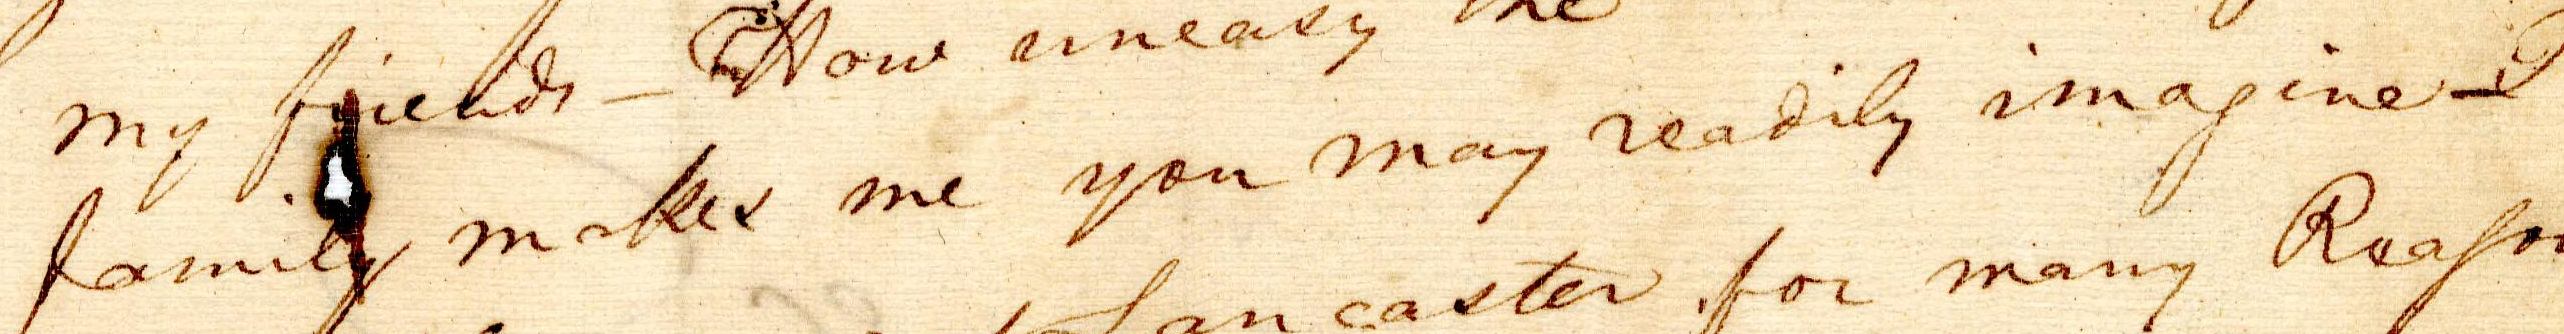family makes me you may readily imagine- I
